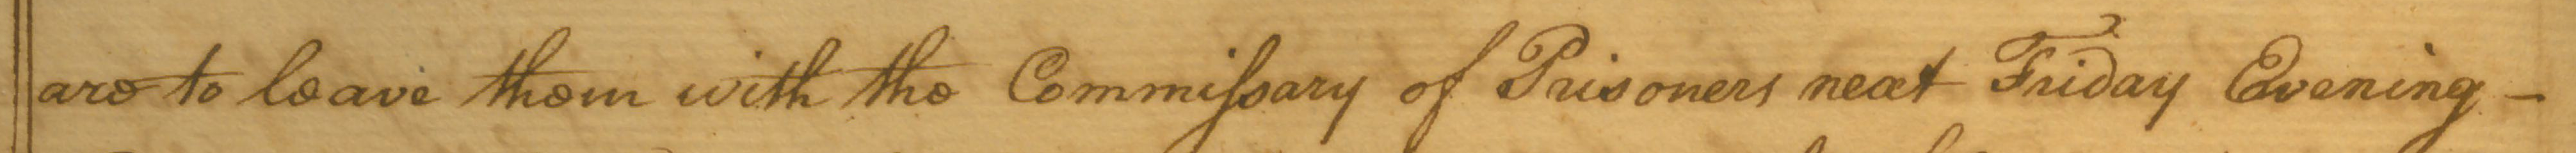are to leave them with the Commissary of Prisoners next Friday Evening-
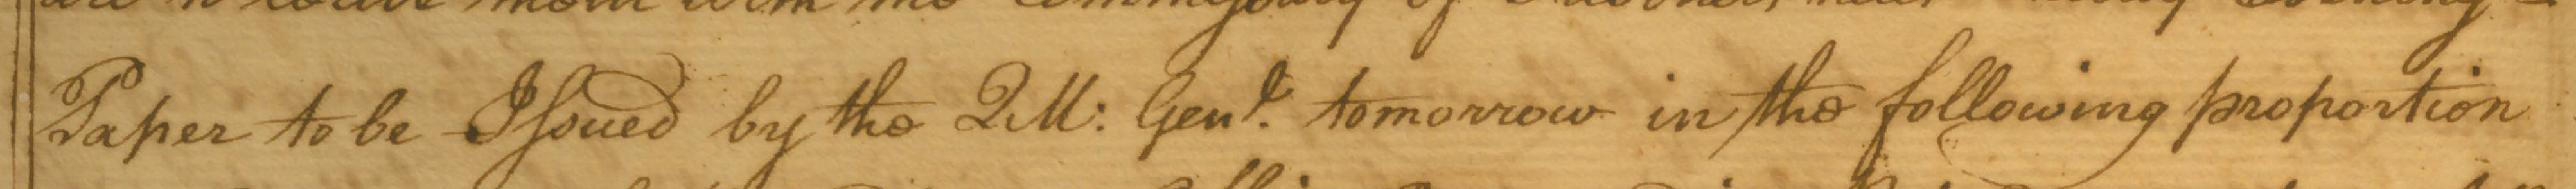Paper to be Issued by the QM: Gen^l. tomorrow in the following proportion
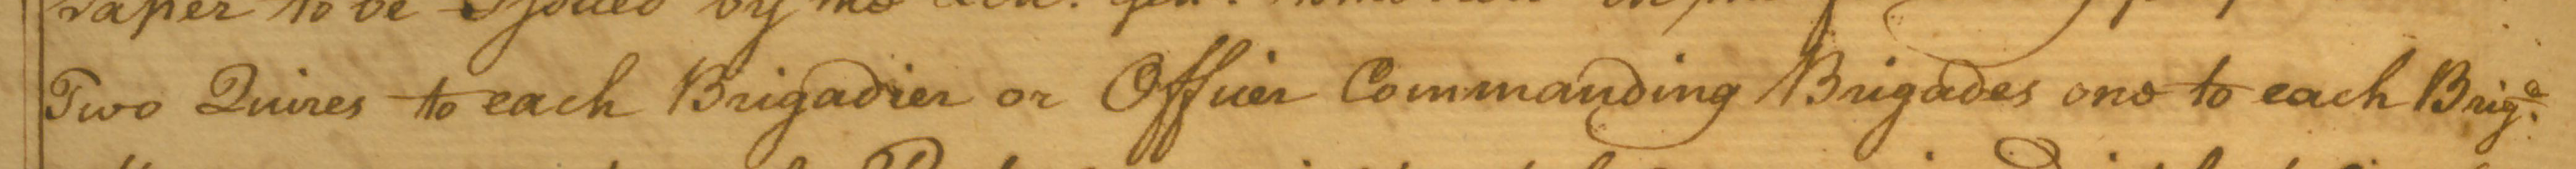Two Quires to each Brigadier or Officer Commanding Brigades one to each Brig^e.
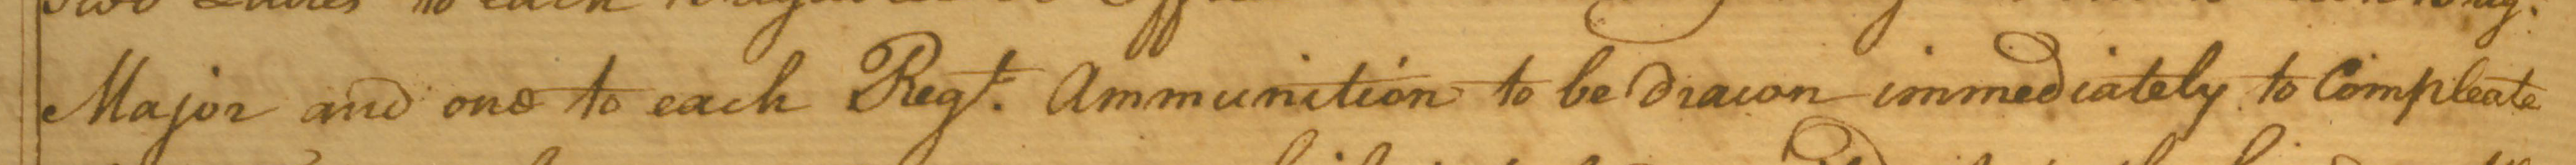Major and one to each Reg^t. Ammunition to be drawn immediately to Compleate
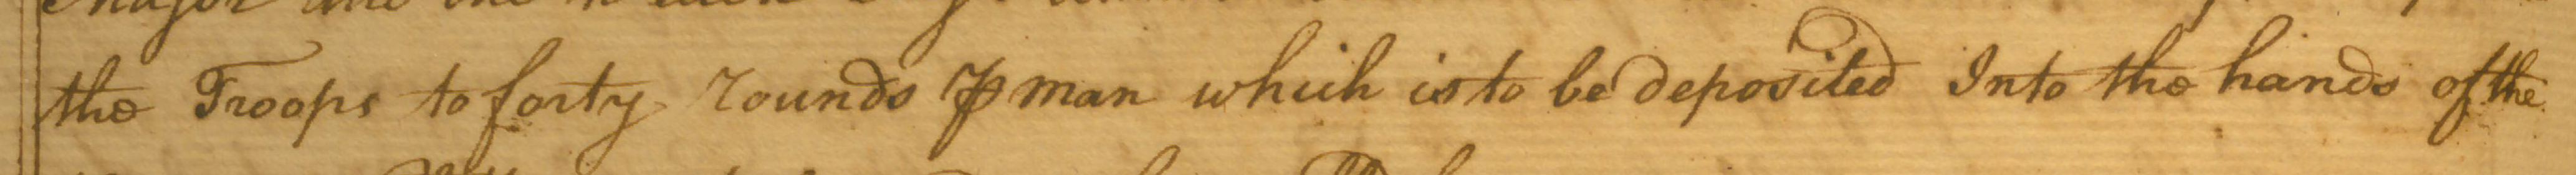the Troops to forty rounds per man which is to be deposited Into the hands of the
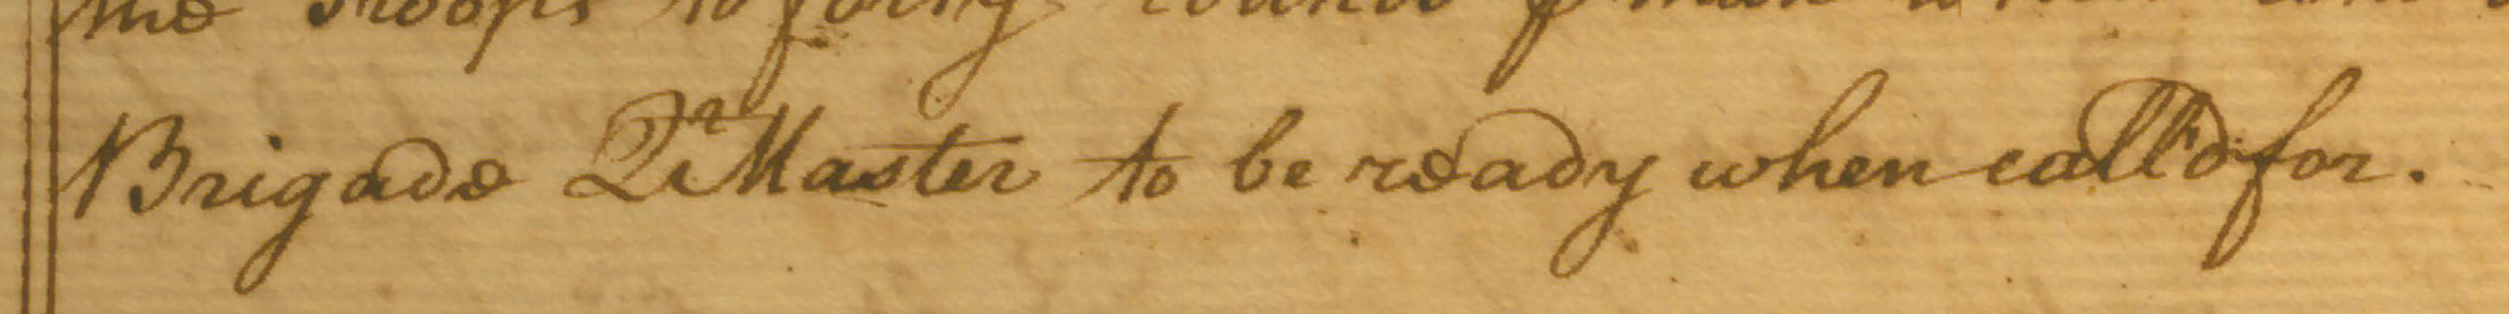Brigade Q^r Master to be ready when call'd for.
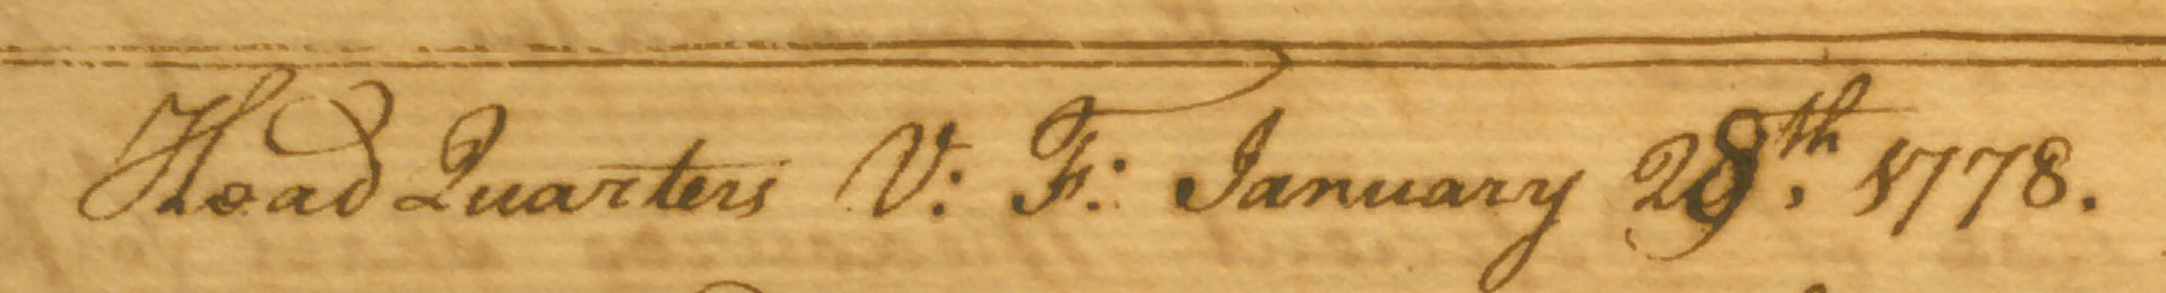Head Quarters V: F: January 28^th. 1778.
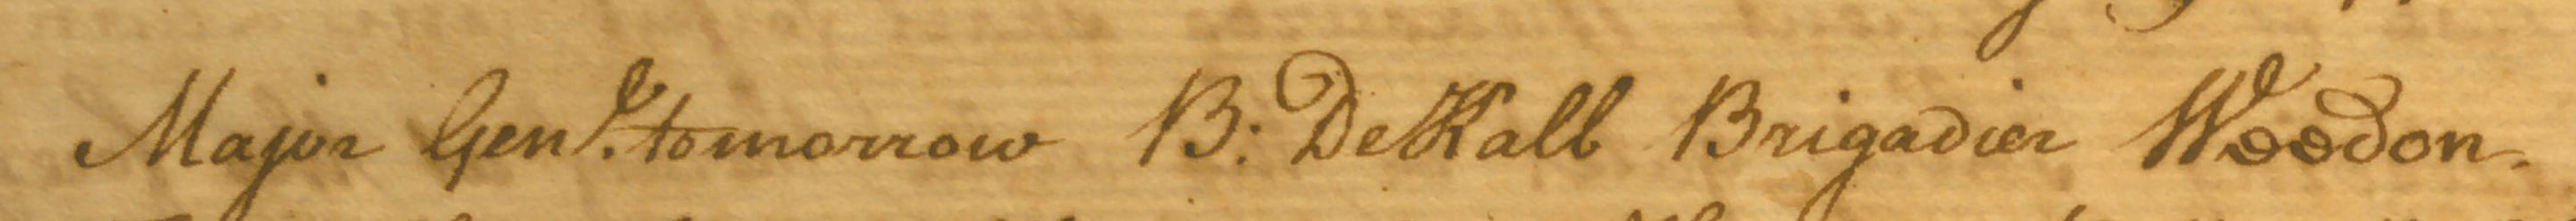Major Gen^l. tomorrow B: DeKalb Brigadier Weedon
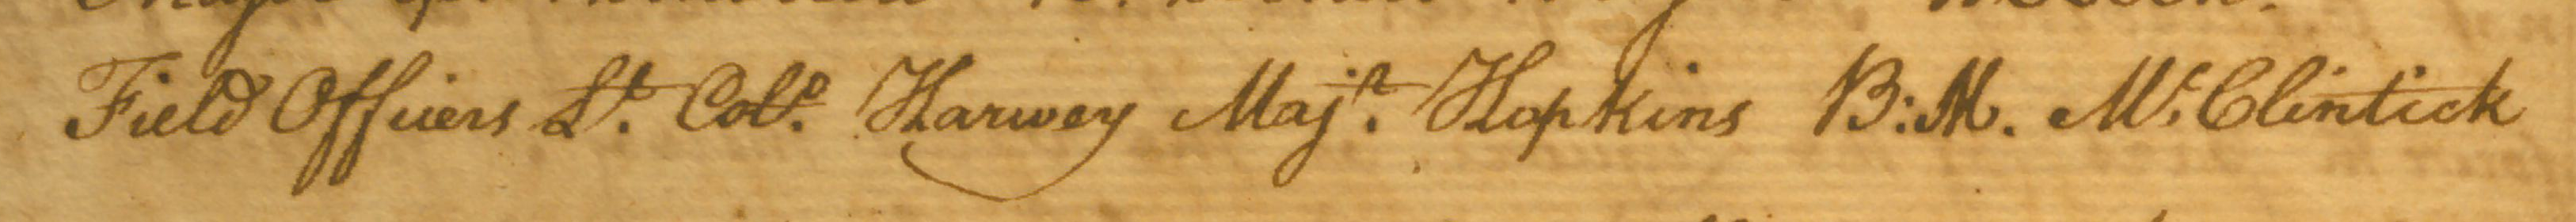Field Officers L^t. Col^o. Harway Maj^r. Hopkins B: M. M^cClintick
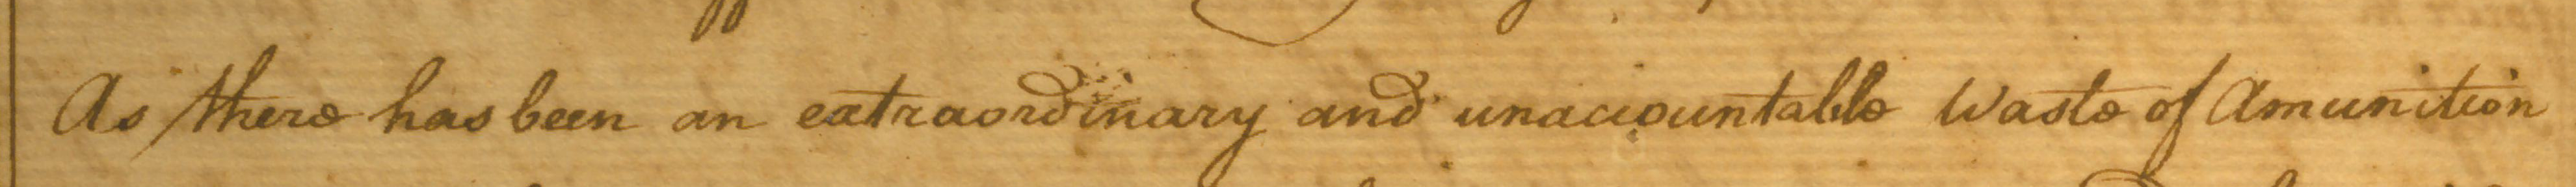As there has been an extraordinary and unaccountable Waste of ammunition
